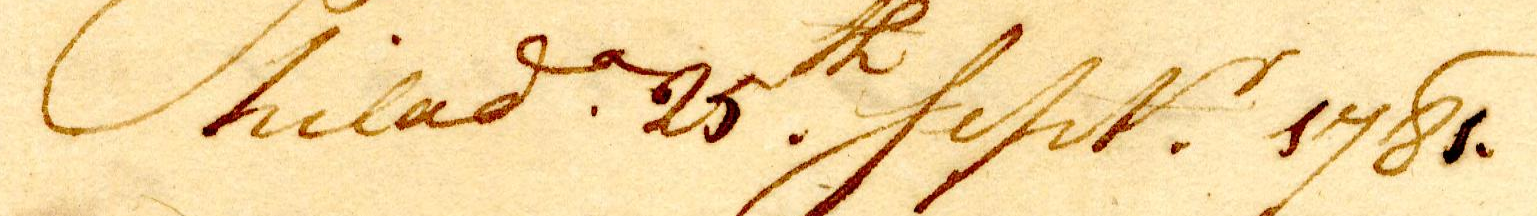Philad^a. 25^th. Sept^r. 1781.
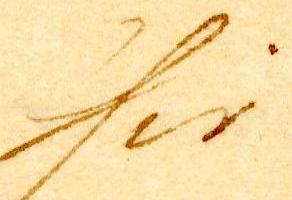Sir
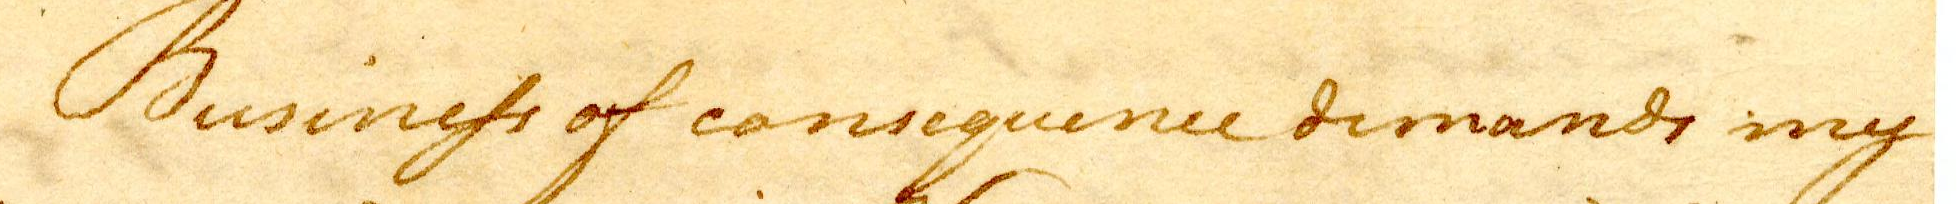Business of consequence demands my
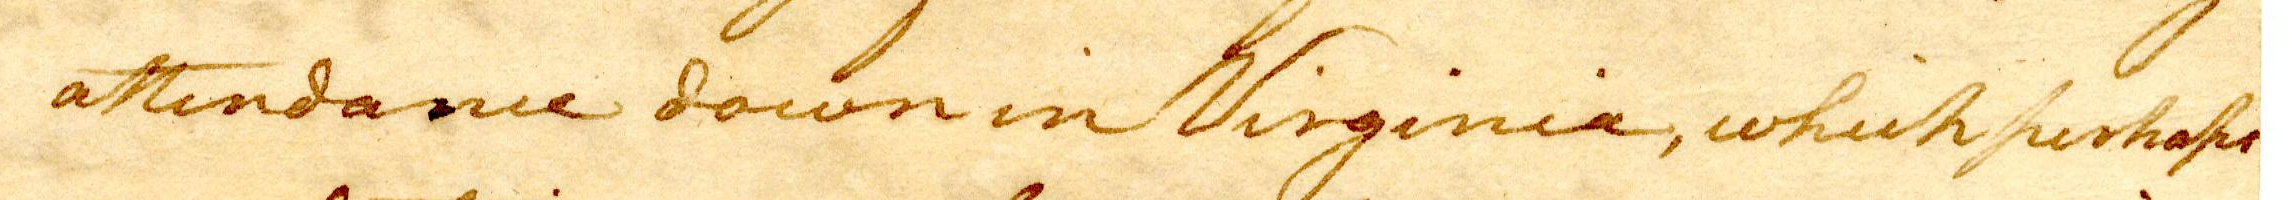attendance down in Virginia, which perhaps
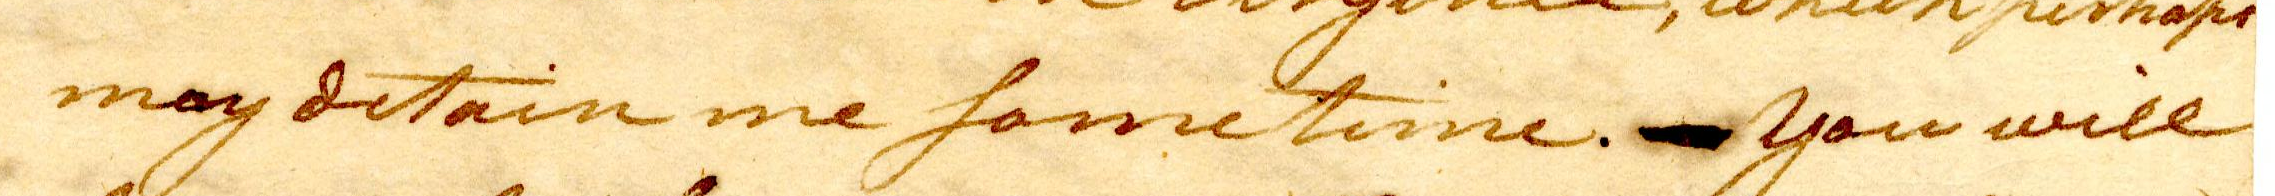may detain me some time. You will
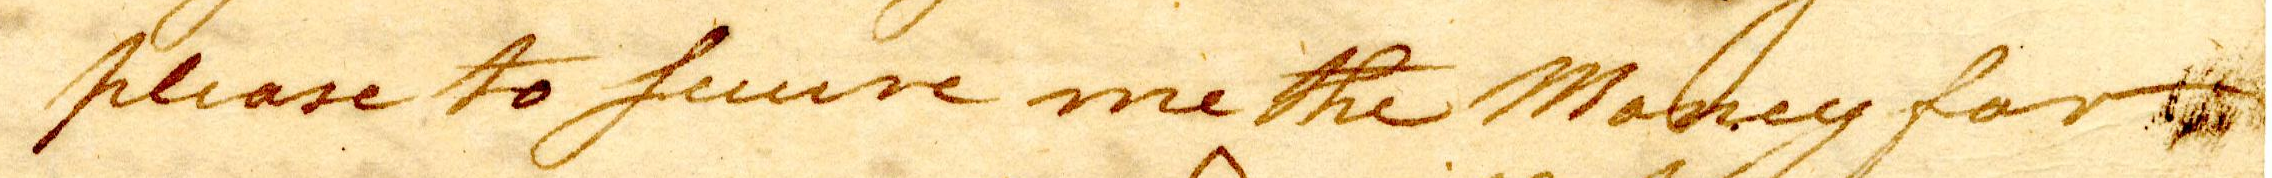please to secure me the Money for
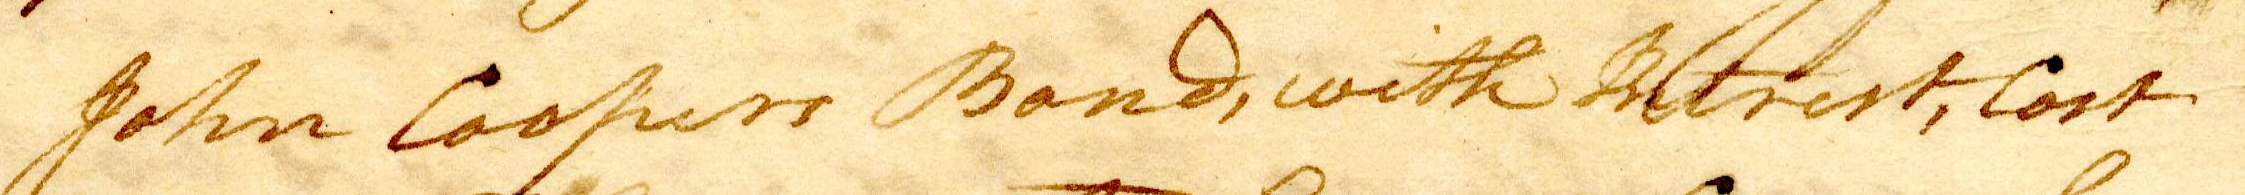John Coopers Bond, with Interest, Cost
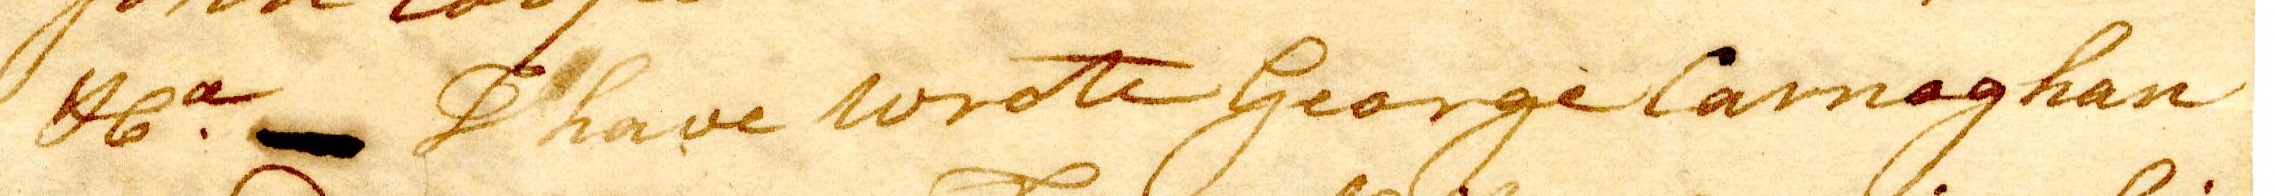&c. I have wrote George Carnaghan
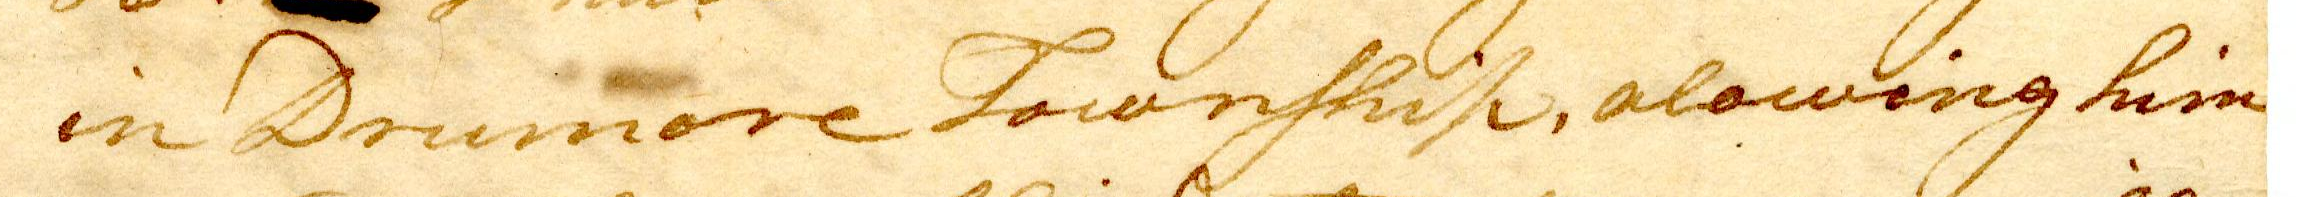in Drumore Township, alowing him
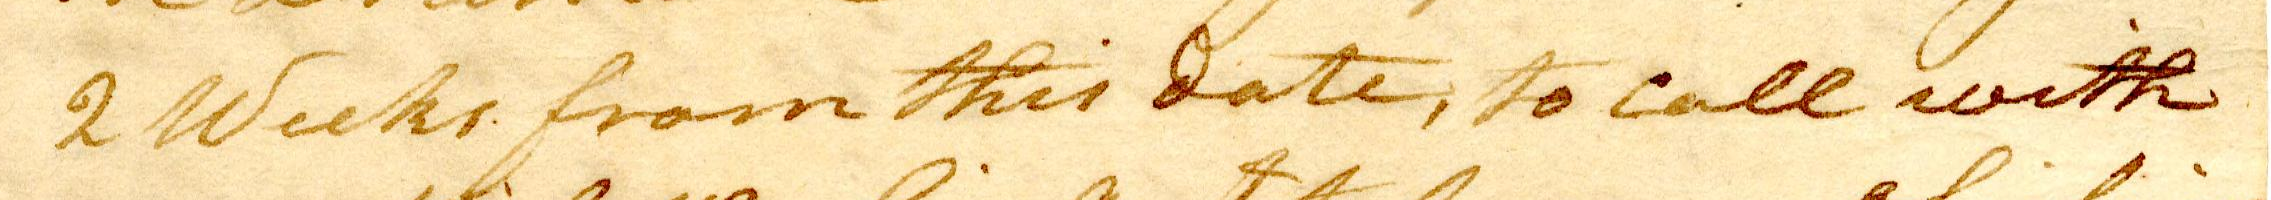2 Weeks from this date, to call with
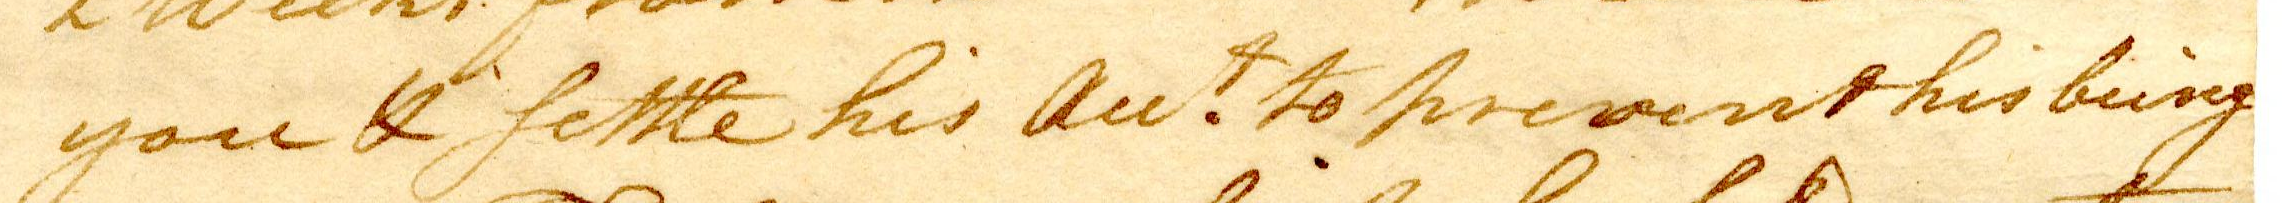you & settle his Acc^t. to prevent his being
